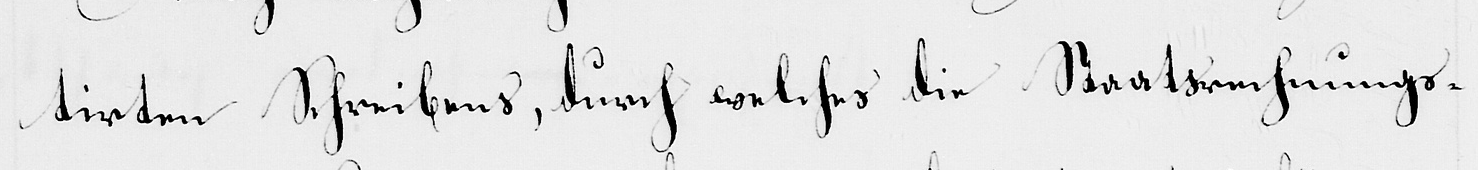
tirten Schreibens, durch welches die Staatsrechnung¬
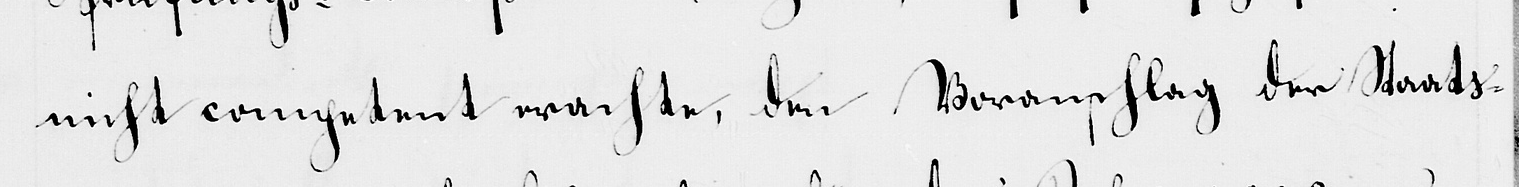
nicht competent erachte, den Voranschlag der Staats¬
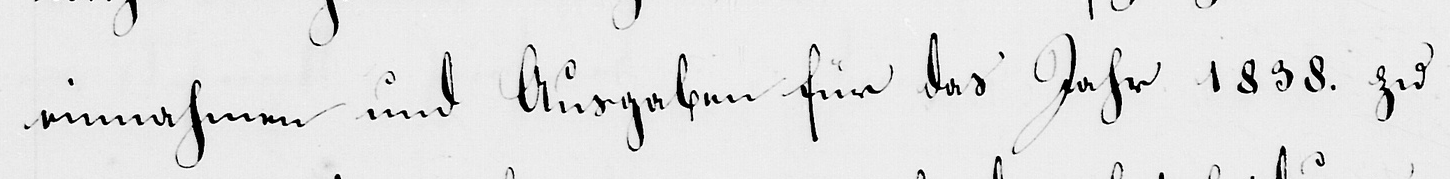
einnahmen und Ausgaben für das Jahr 1838. zu
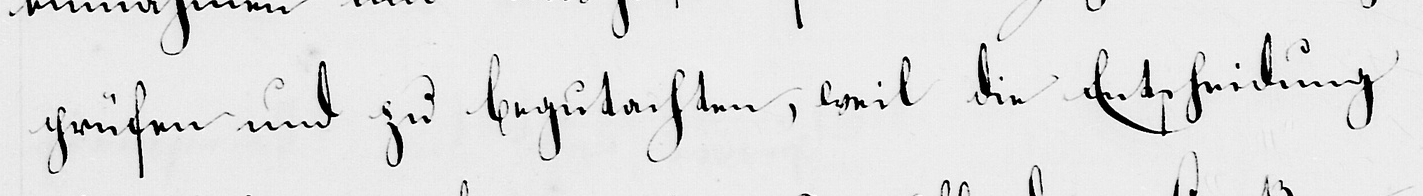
prüfen und zu begutachten, weil die Entscheidung
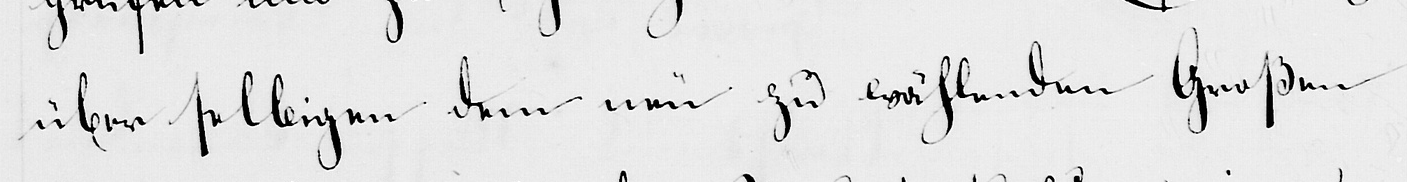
über selbigen dem neu zu wählenden Großen
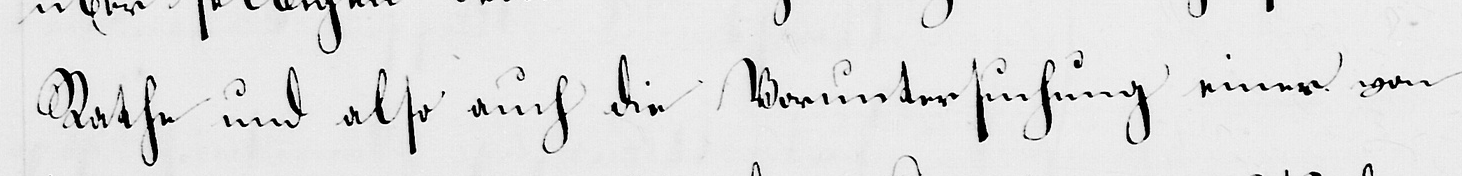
Rathe und also auch die Voruntersuchung einer von
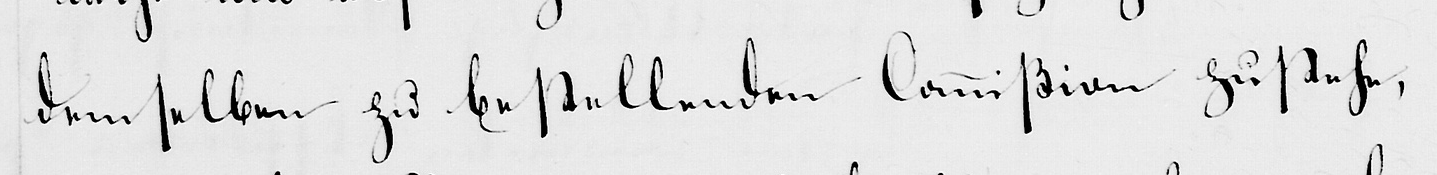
demselben zu bestellenden Commißion zustehe,
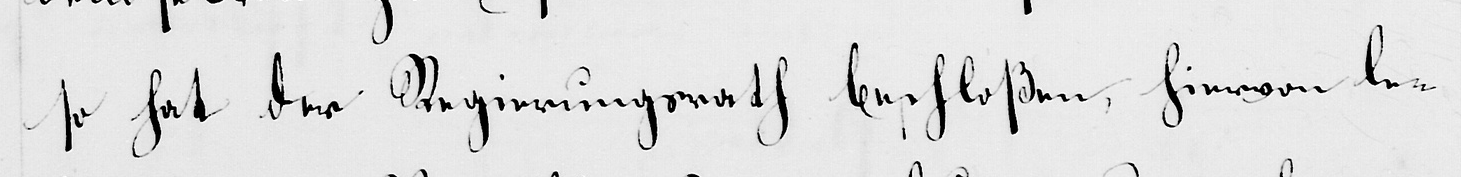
so hat der Regierungsrath beschloßen, hiervon le¬
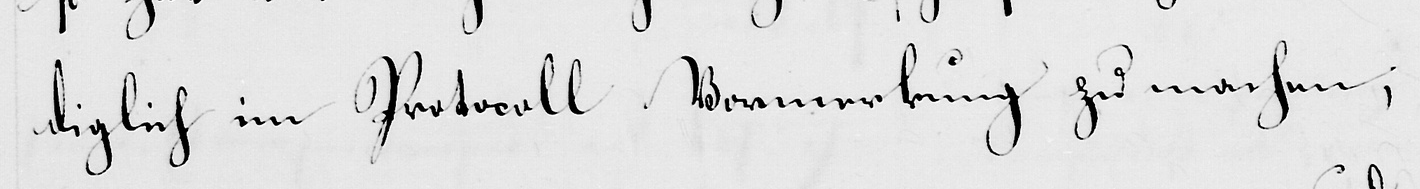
diglich im Protocoll Vormerkung zu machen,
